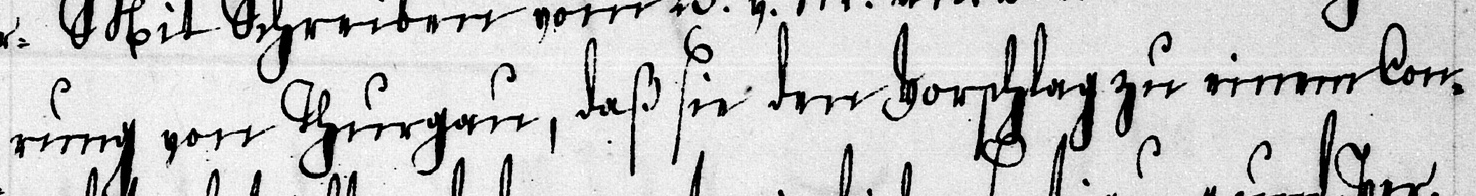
rung von Thurgau, daß sie den Vorschlag zu einem Con¬
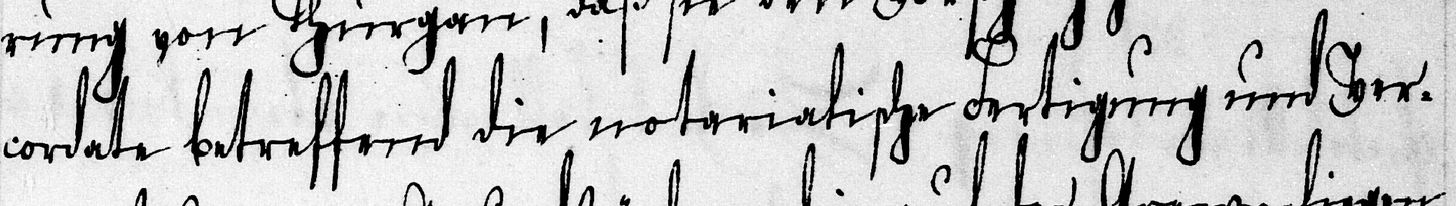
cordate betreffend die notariatische Fertigung und Vers¬
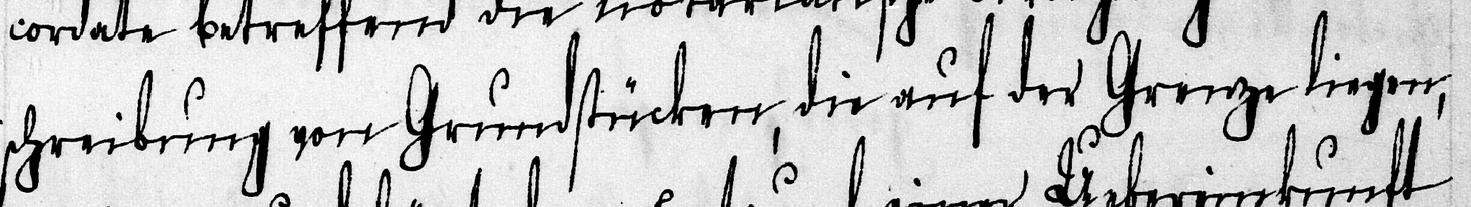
chreibung von Grundstücken, die auf der Grenze liegen,
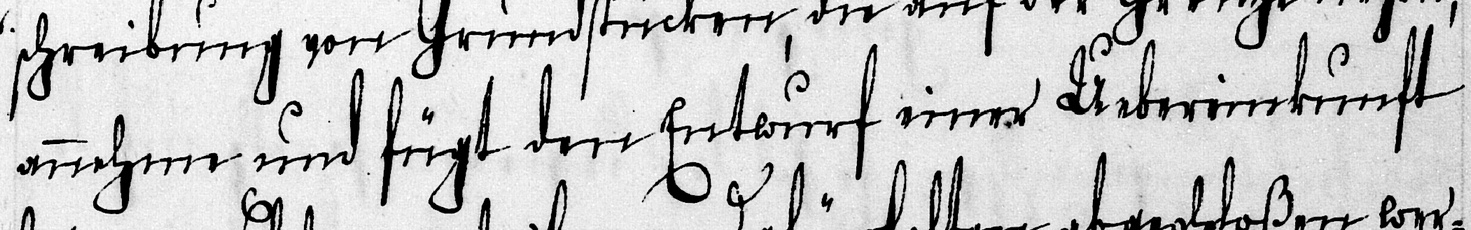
annehme und fügt den Entwurf einer Uebereinkunft
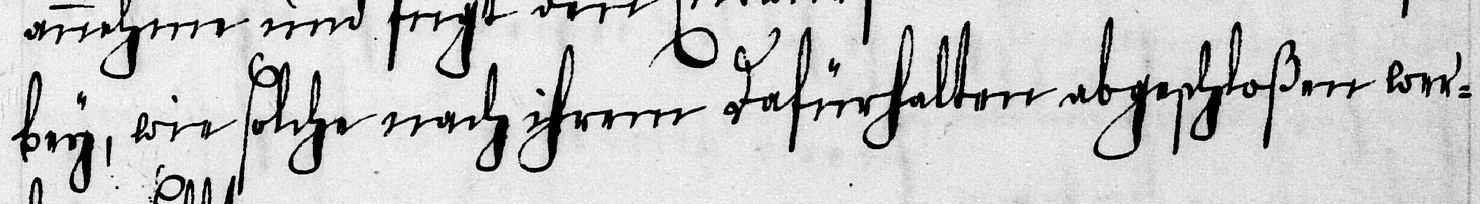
bey, wie solche nach ihrem Dafürhalten abgeschloßen wer¬
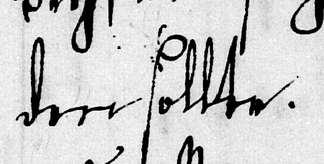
den sollte.
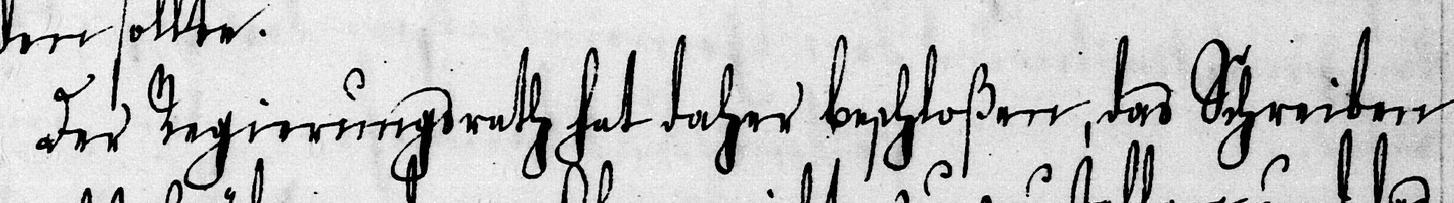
Der Regierungsrath hat daher beschloßen, das Schreiben
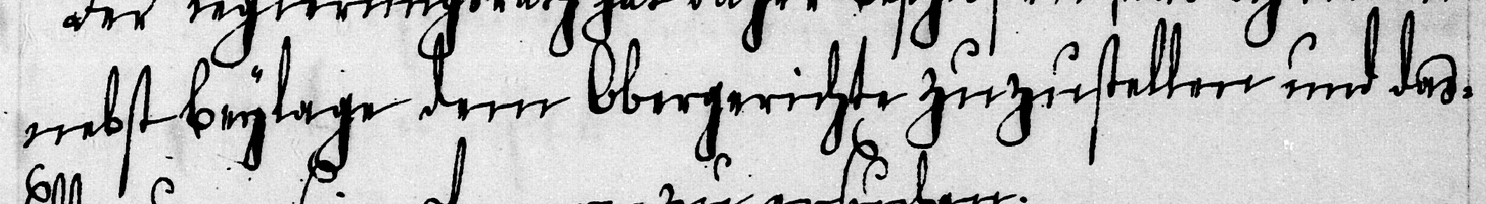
nebst Beylage dem Obergerichte zuzustellen und das¬
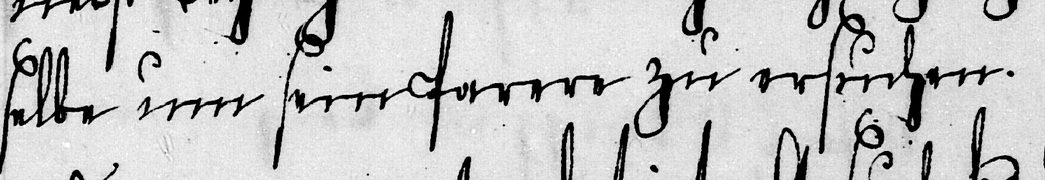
selbe um sein Parere zu ersuchen.
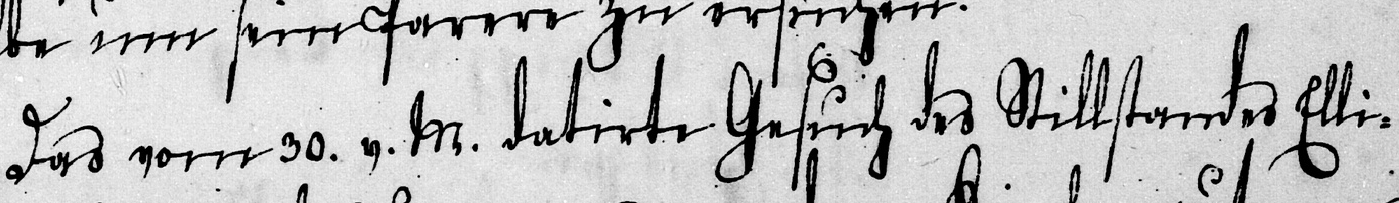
Das vom 30. v. M. datirte Gesuch des Stillstandes Elli¬
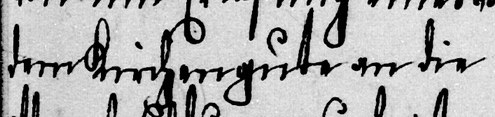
dem Kirchengute an die
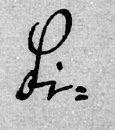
lei¬
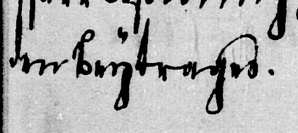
den Beytrages,
